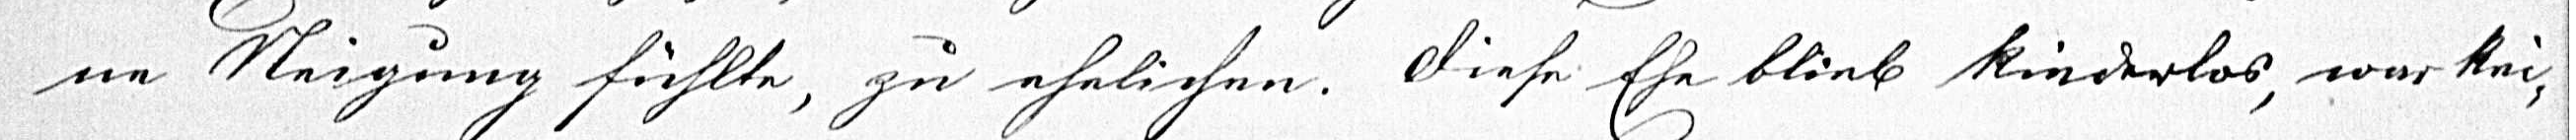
ne Neigung fühlte, zu ehelichen. Diese Ehe blieb kinderlos, war kei¬
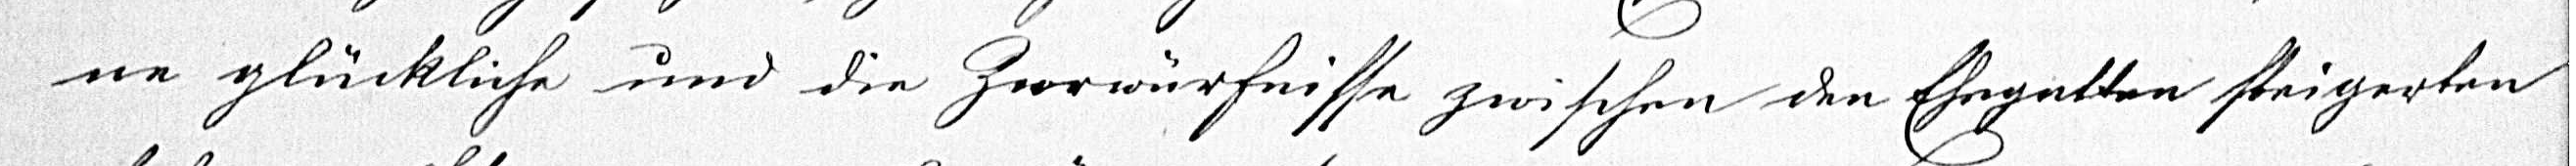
ne glückliche und die Zerwürfnisse zwischen den Ehegatten steigerten
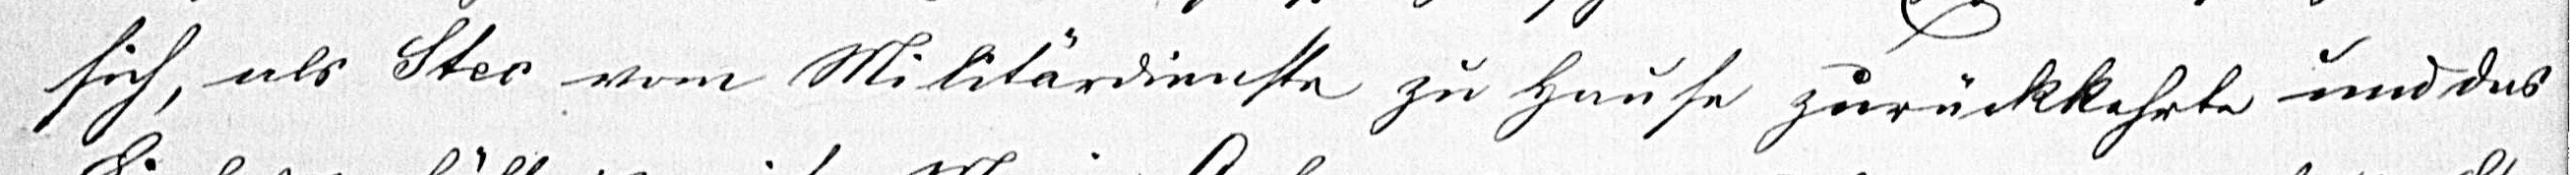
sich, als Stec vom Militärdienste zu Hause zurückkehrte und das
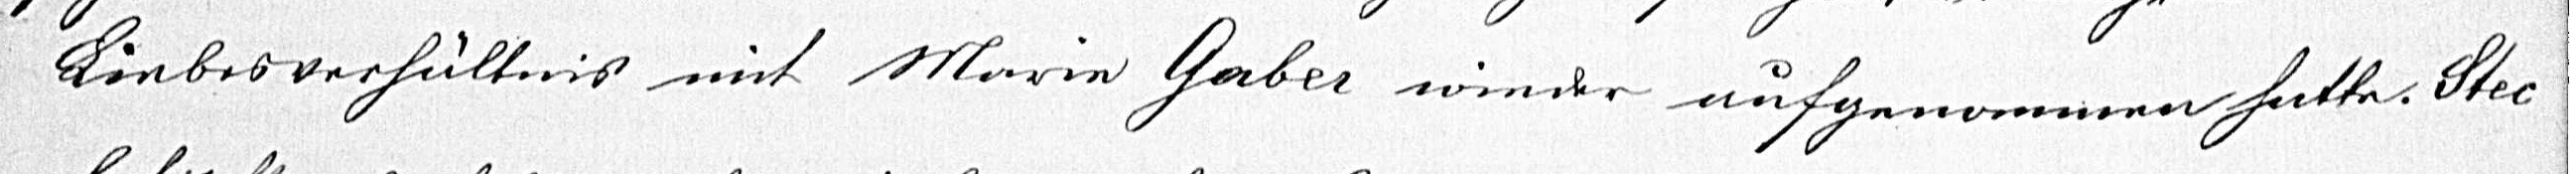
Liebesverhältnis mit Marie Gaber wieder aufgenommen hatte. Stec
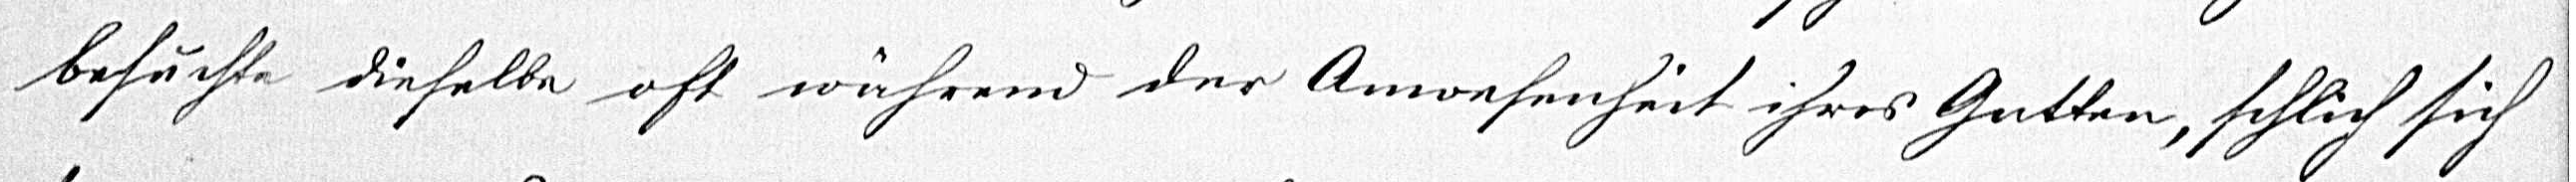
besuchte dieselbe oft während der Anwesenheit ihres Gatten, schlich sich
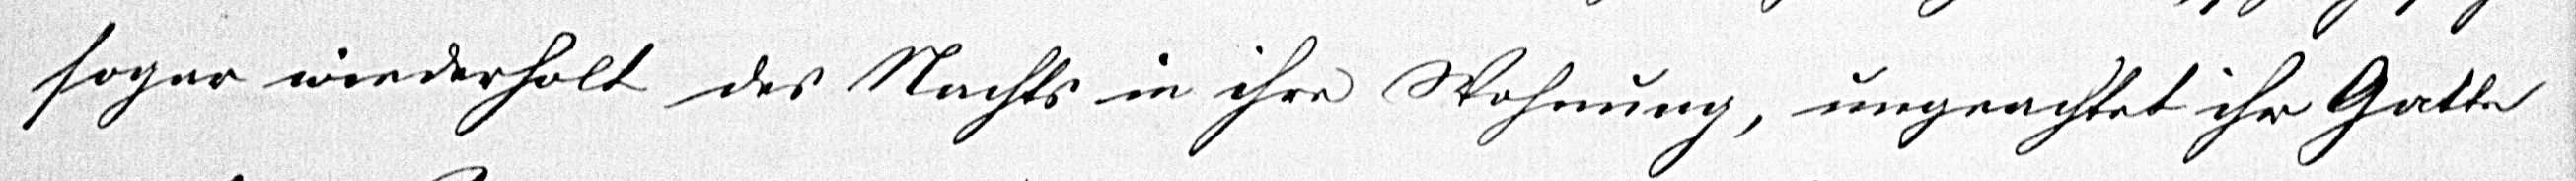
sogar wiederholt des Nachts in ihre Wohnung, ungeachtet ihr Gatte
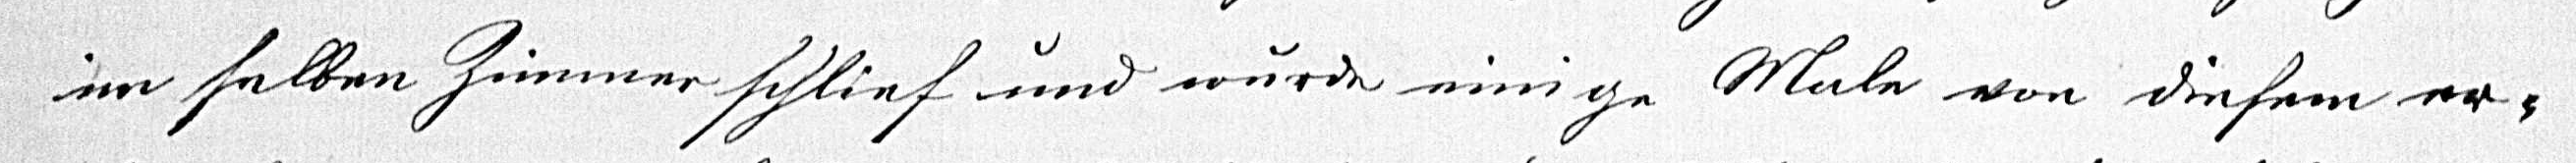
im selben Zimmer schlief und wurde einige Male von diesem er¬
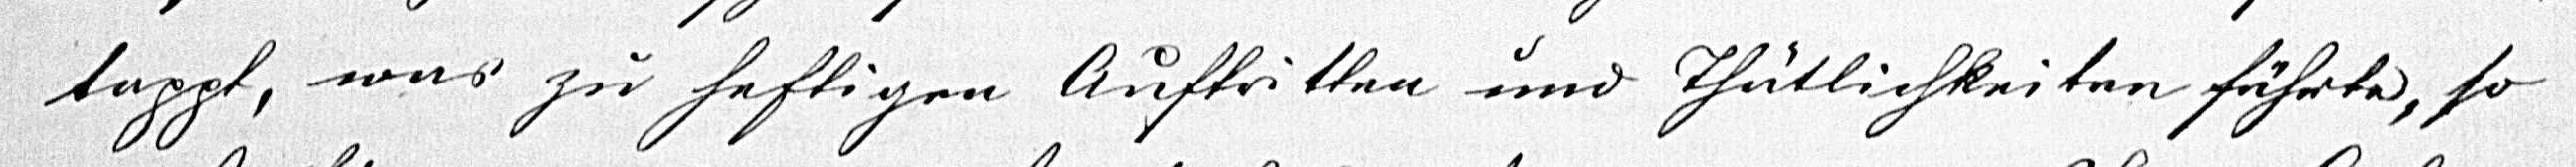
tappt, was zu heftigen Auftritten und Thätlichkeiten führte, so
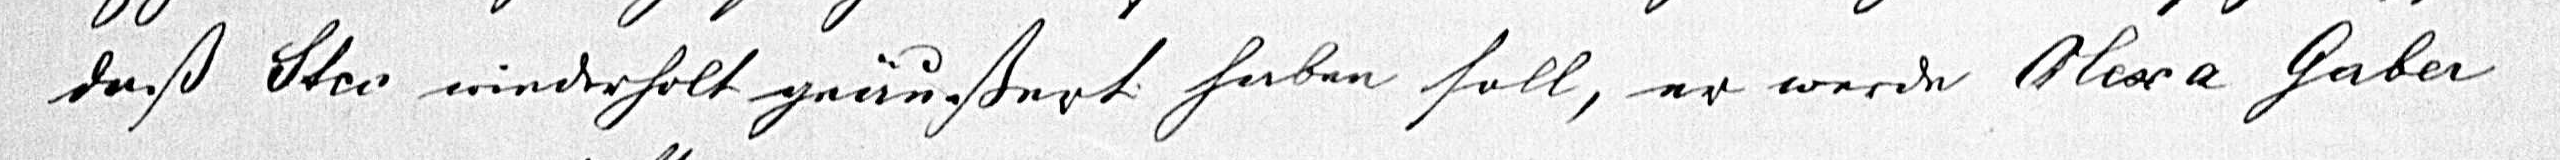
daß Stec wiederholt geäußert haben soll, er werde Olexa Gaber
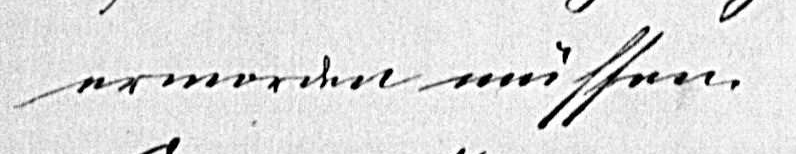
ermorden müssen.
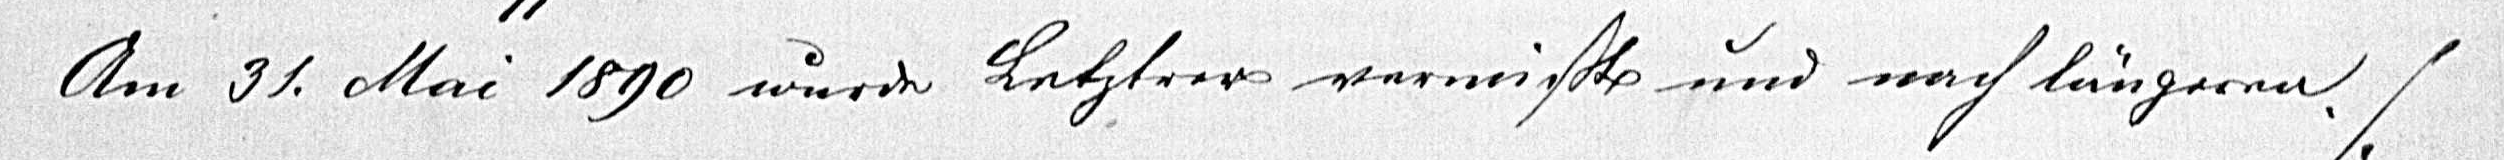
Am 31. Mai 1890 wurde Letztrer vermißt und nach längeren
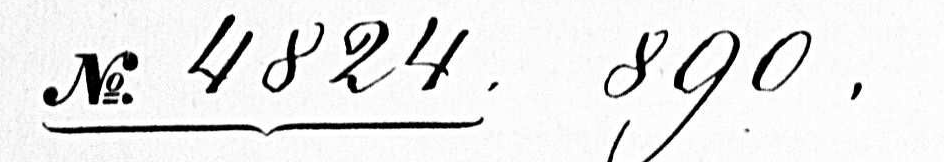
No. 4824. 890.
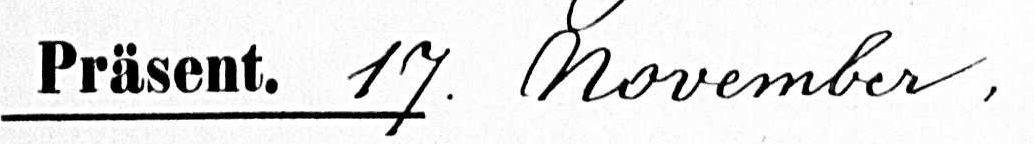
Präsent. 17. November.
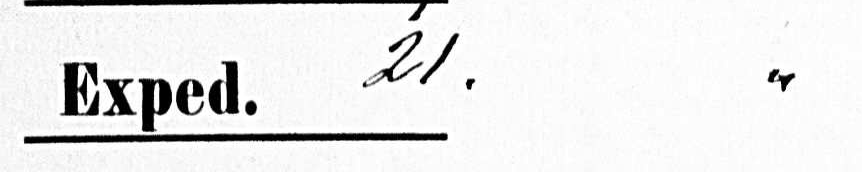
Exped. 21. November
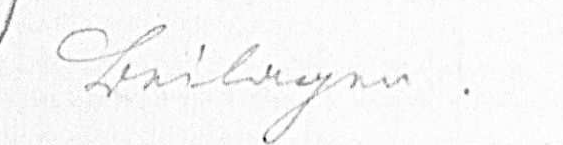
Beilagen.
